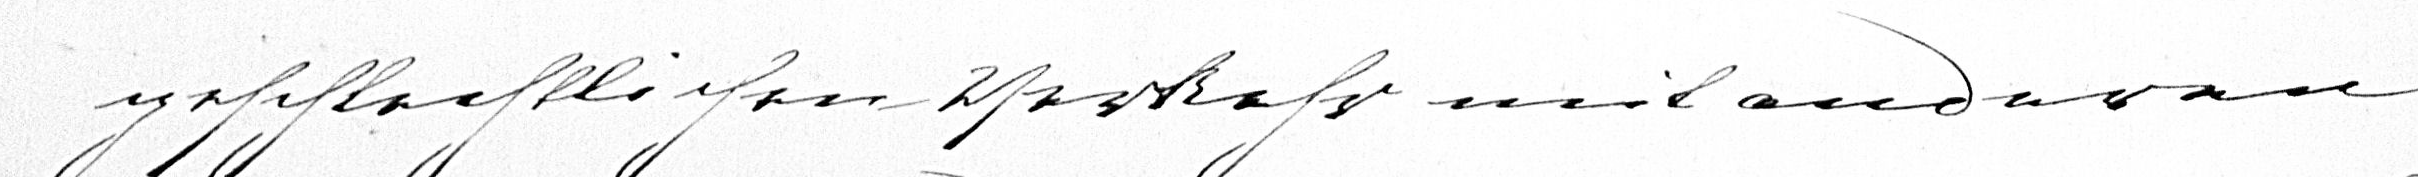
geschlechtlichen Verkehr mit anderen
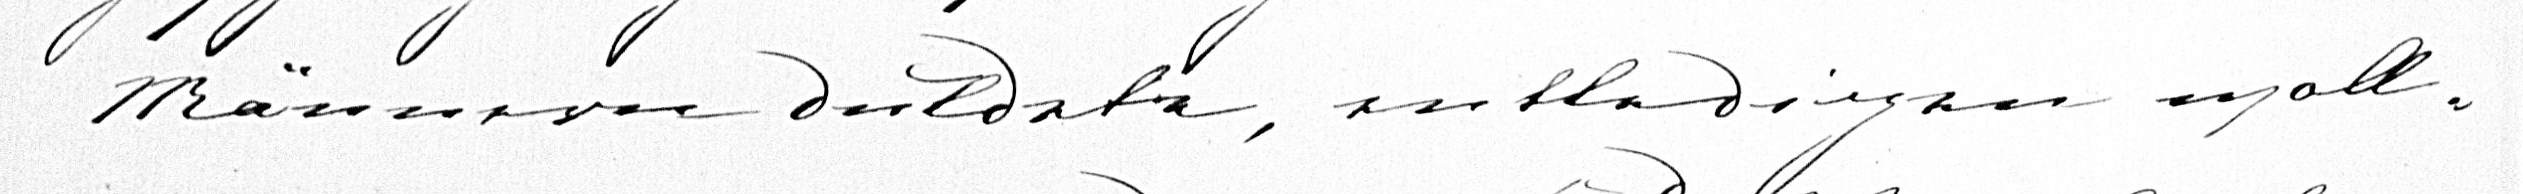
Männern duldete, entledigen woll¬
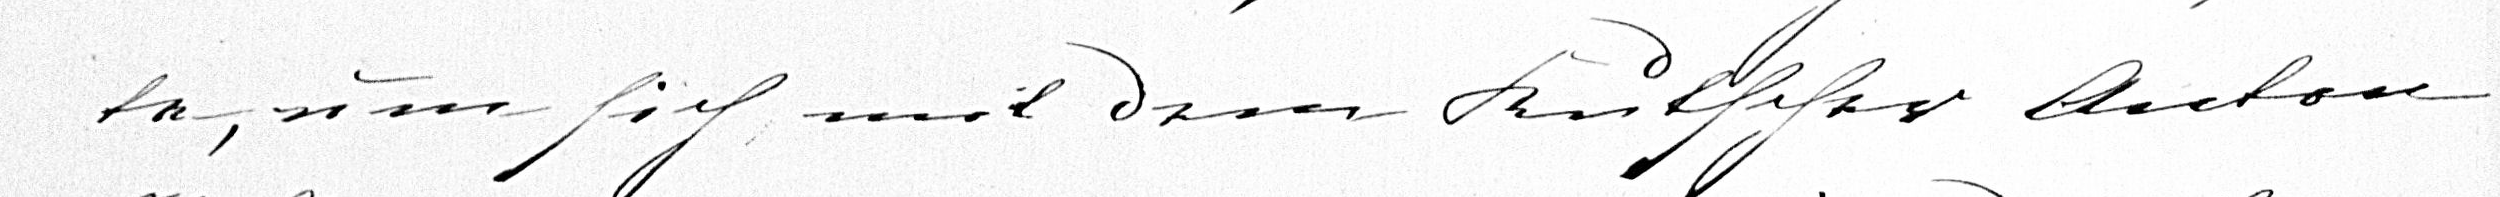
te, um sich mit dem Kutscher Anton
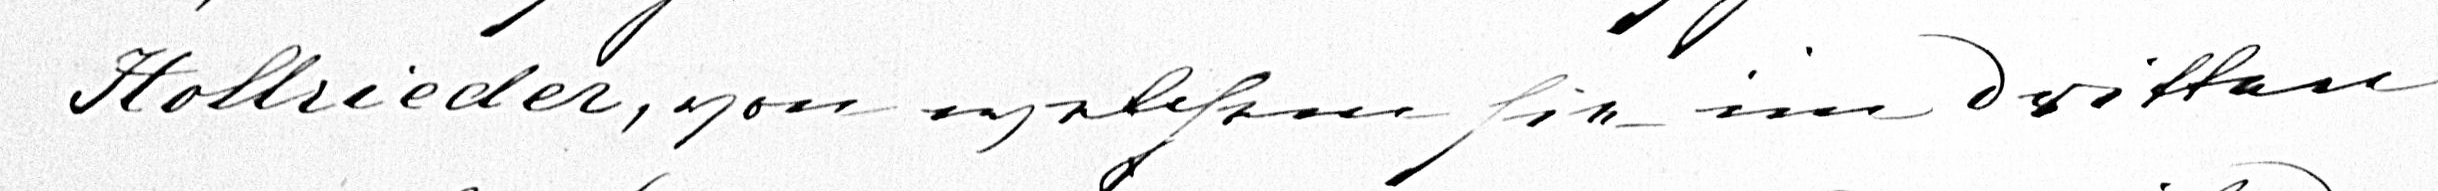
Hollrieder, von welchem sie im dritten
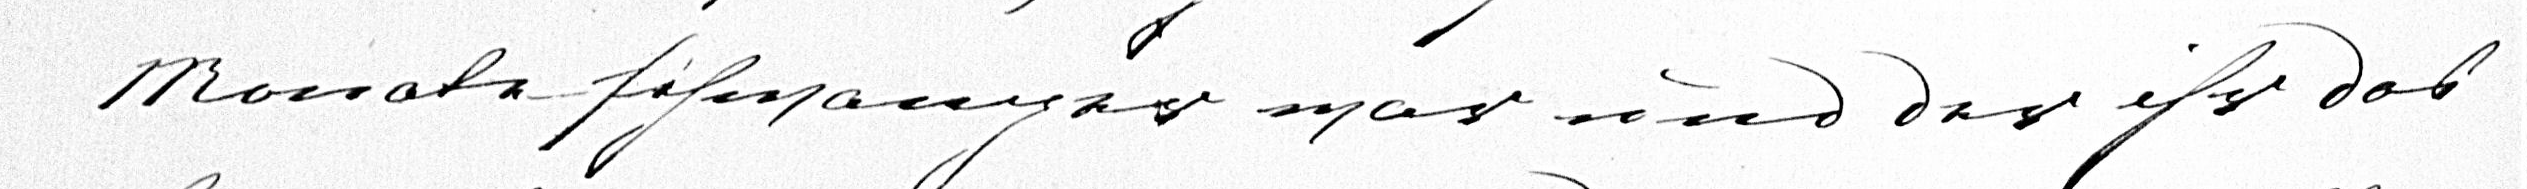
Monateschwanger war und der ihr das
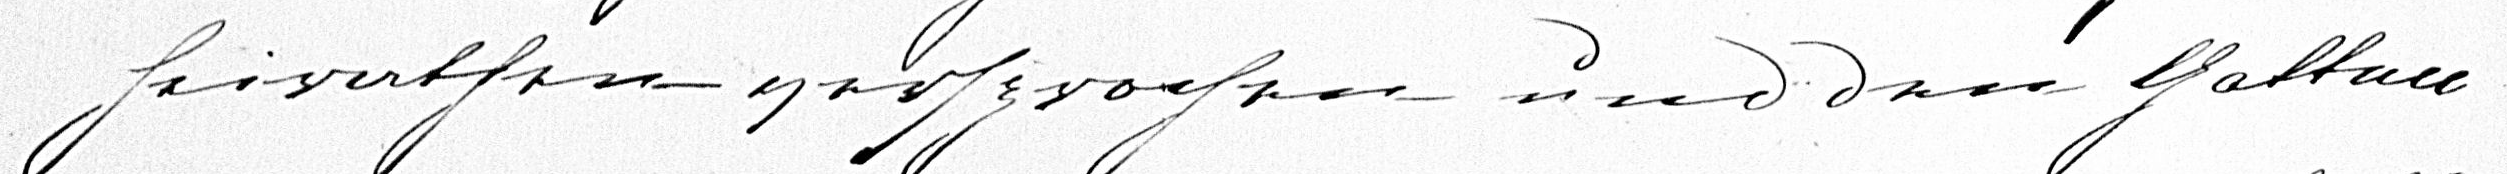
heirathen versprochen und den Gattaxx
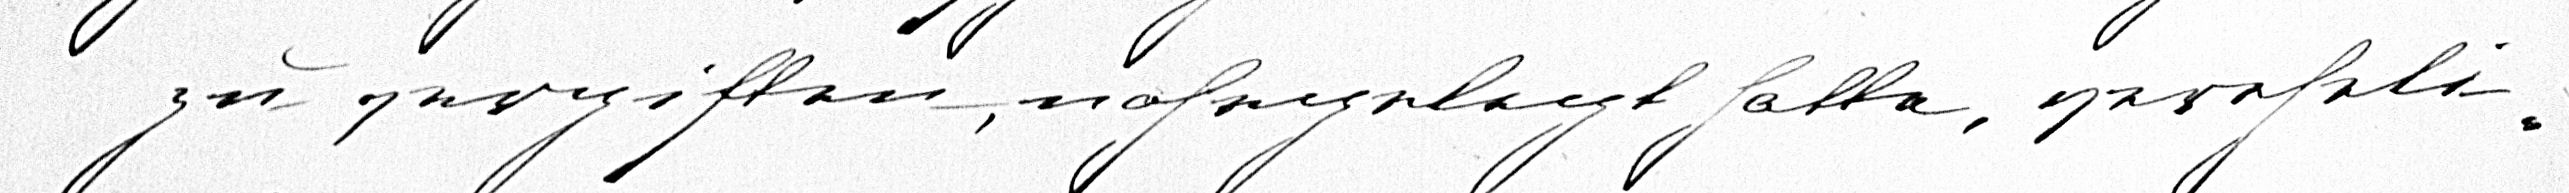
zu vergiften, nahegelegt hatte, vereheli¬
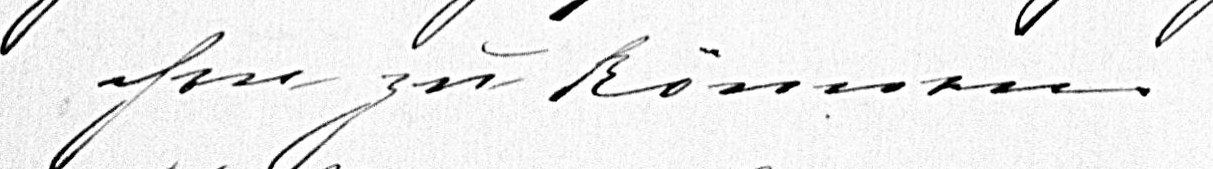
chen zu können.
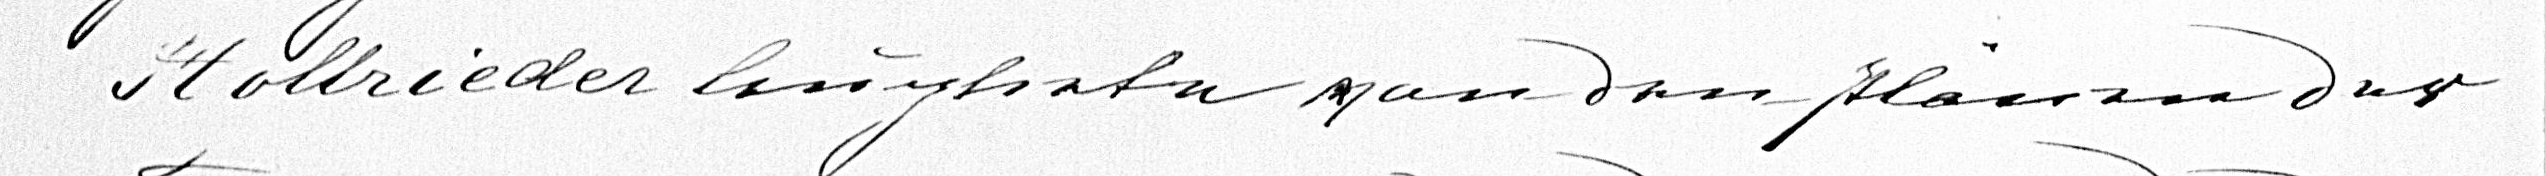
Hollrieder Augxxte von den Plänen der
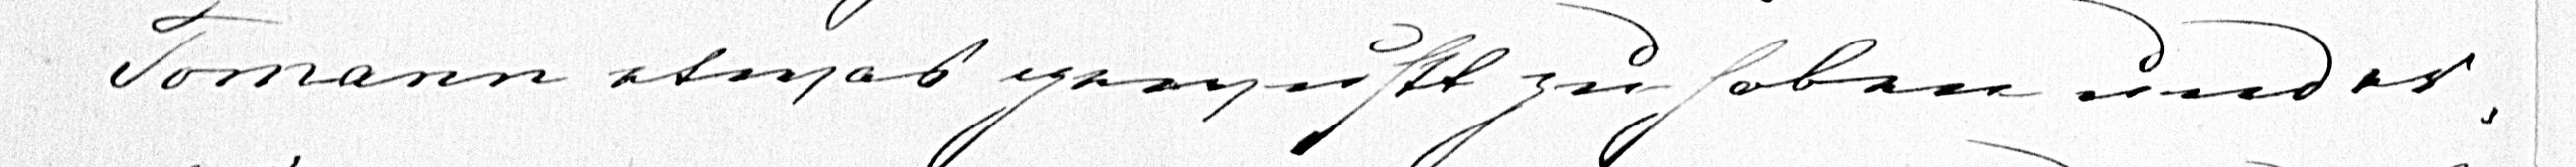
Tomann etwas gewußt zu haben und er¬
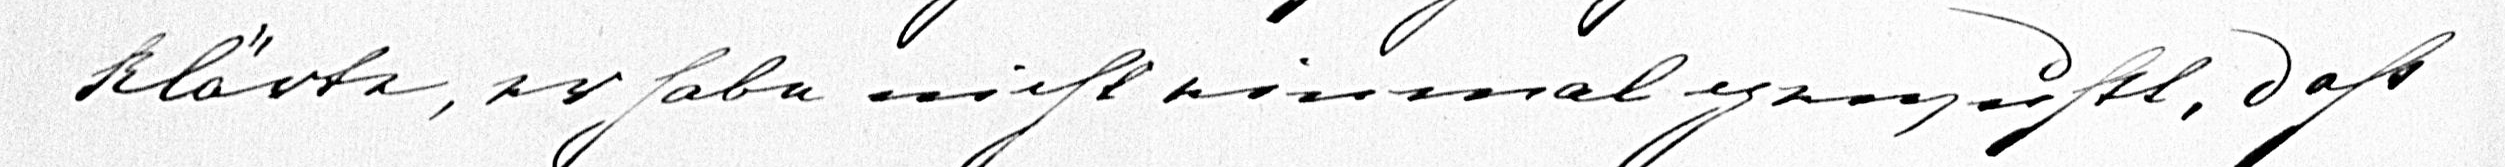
klärte, er habe nicht einmal gewußt, daß
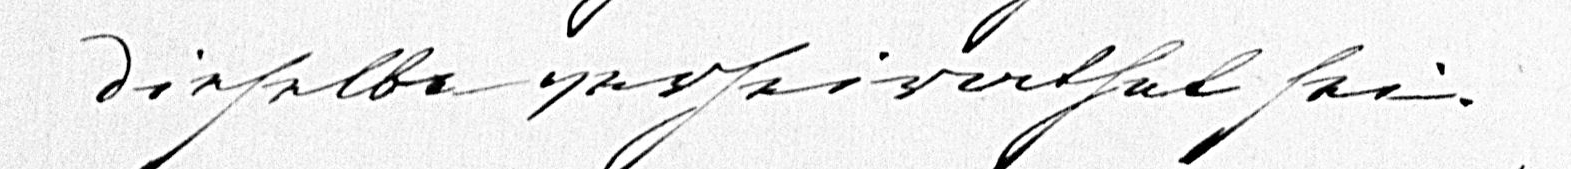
dieselbe verheirathet sei.
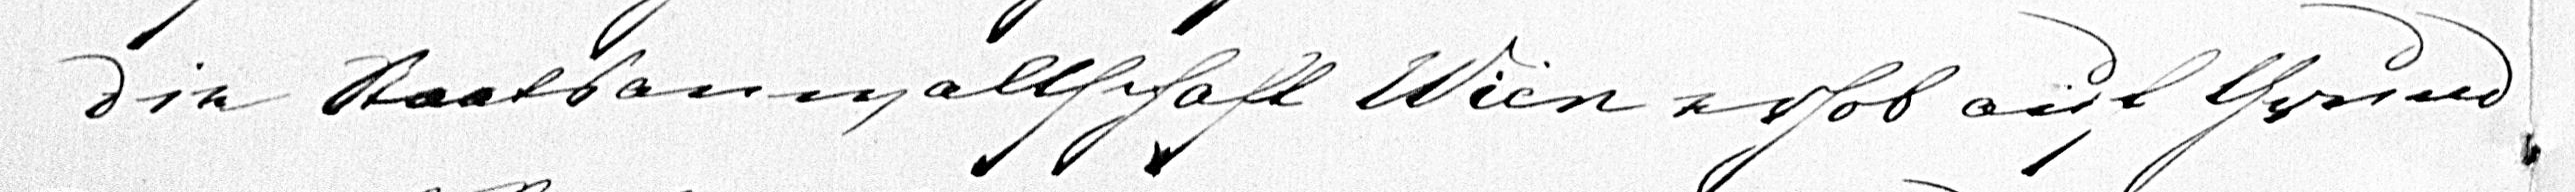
Die Staatsanwaltschaft Wien erhob auf Grund
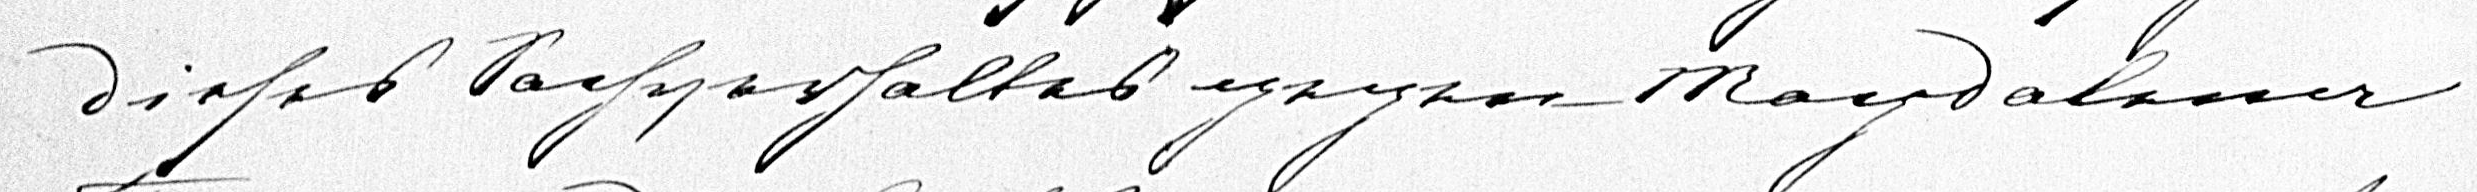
dieses Sachverhaltes gegen Magdalena
